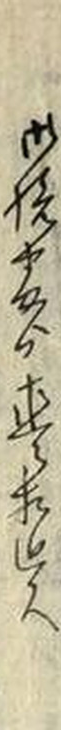御膳番ゟ直々相廻ス
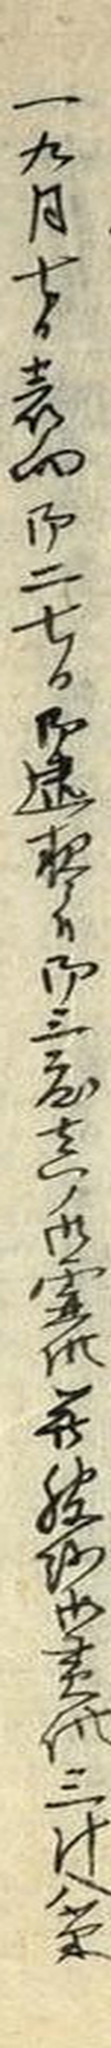一九月七日表向御二七日御逮夜ニ付御三度真之御霊供并服紗御灵供三汁八菜
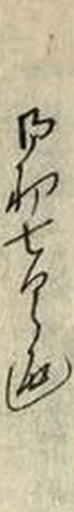御初七日之通
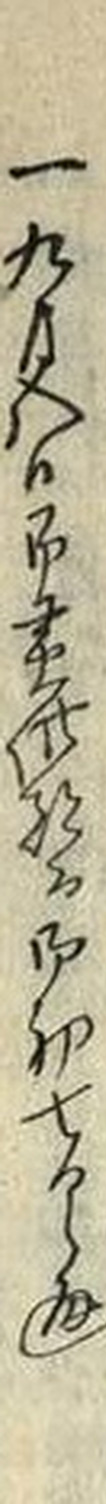一九月八日御灵供都而御初七日之通
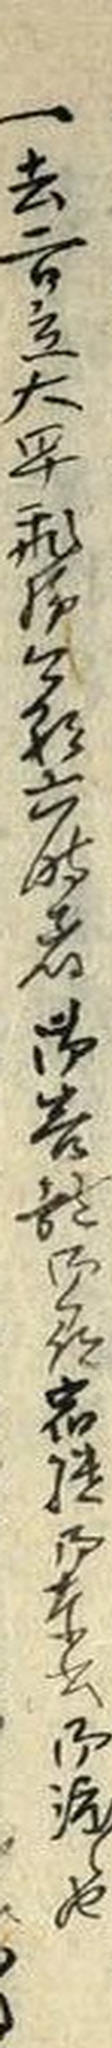一去二日立大早飛脚今朝六時着御容體御尋宿継御奉書御渡候由
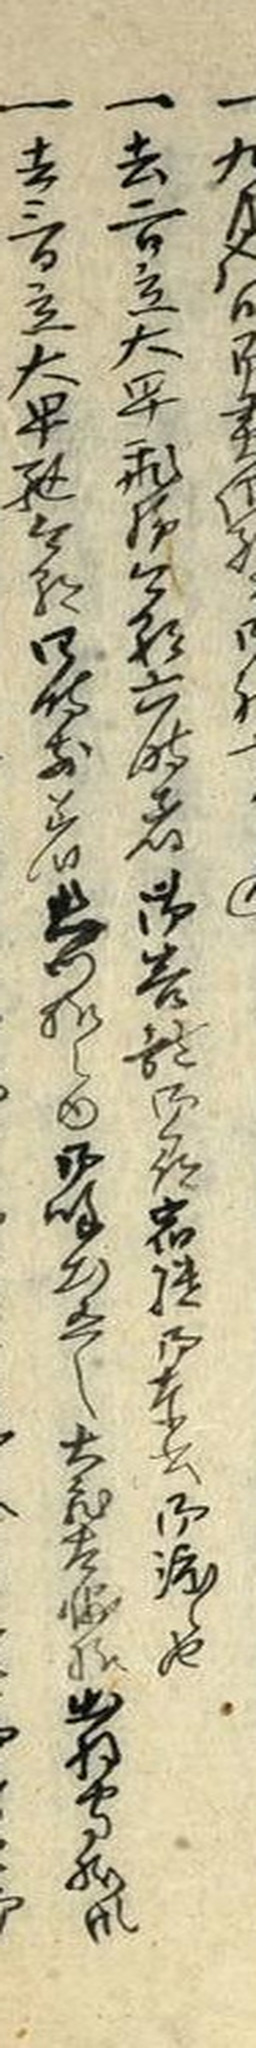一去三日立大早駆今朝四時前着御一門様之内御呼出有之大蔵太輔様出羽守様御
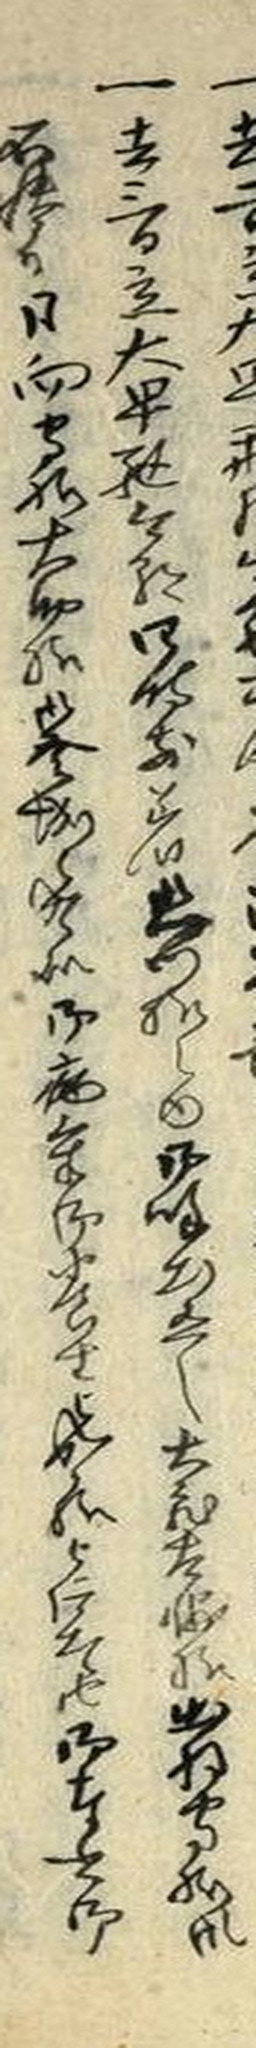不快ニ付日向守様大助様御登城被成候処御病気御養生被成候様被仰出候由御奉書御
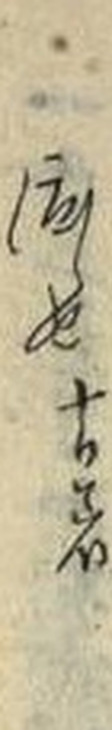渡候由十日着

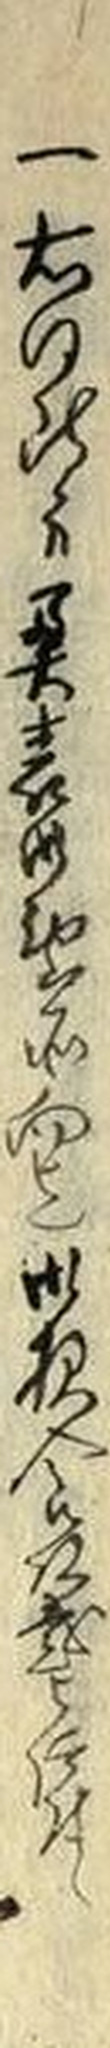一右同断ニ付奥表御台所向迄御夜食頂戴被仰付候
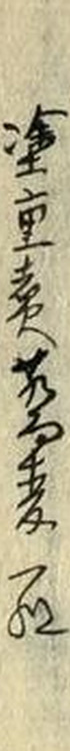塗重煮蕎麦一組
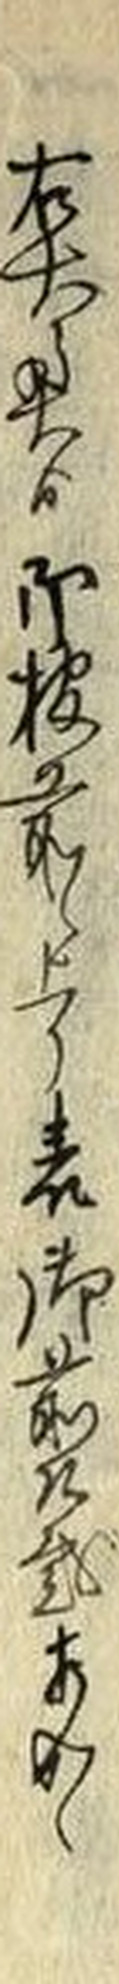右大奥ゟ御棺前へ上り表御前頂戴相成候
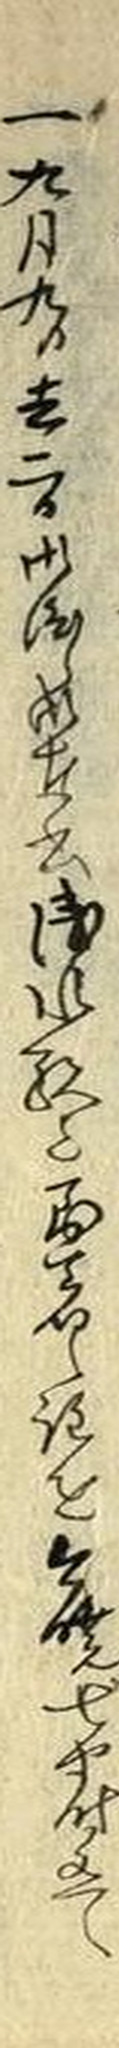一九月九日去二日御渡し御奉書浅水駅迄到着之注進今暁七半時有之
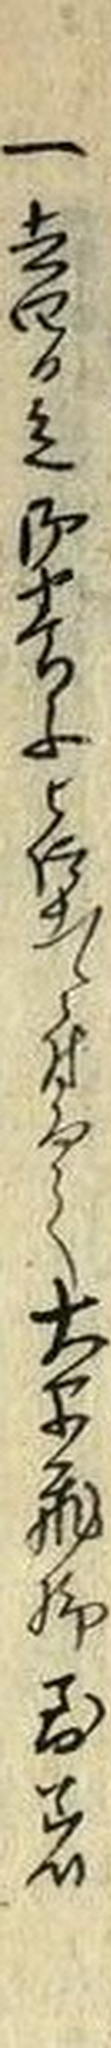一去四日立御養子被仰出候ニ付而之大早飛脚到着
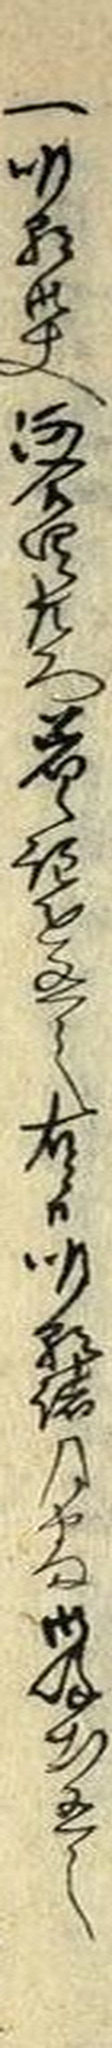一明朝御使河合四郎左衛門着之注進有之右ニ付明朝諸月番御呼出有之
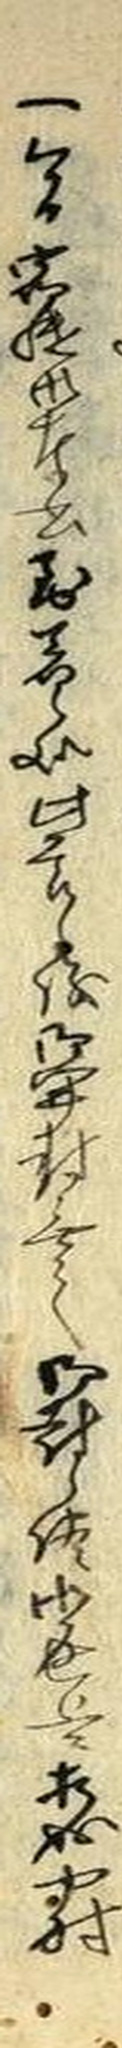一今日宿継御奉書到着之処此節之儀御開封無之御封之儘御返上ニ相成中村
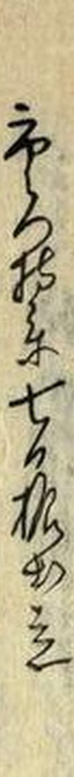市郎右衛門持参七日振出立
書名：少傅日録抄（斉善付側向頭取日記、江戸并道中、初入在国、逝去後…
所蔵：福井県文書館 Fukui Prefectural Archives
